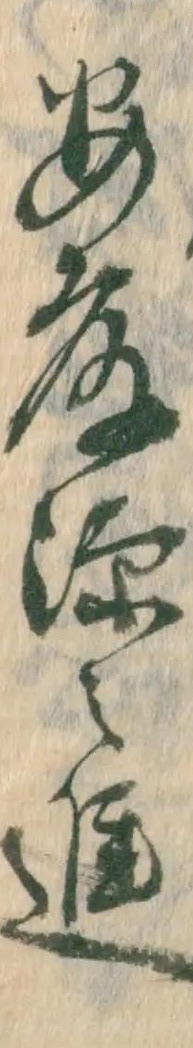安藤源之進

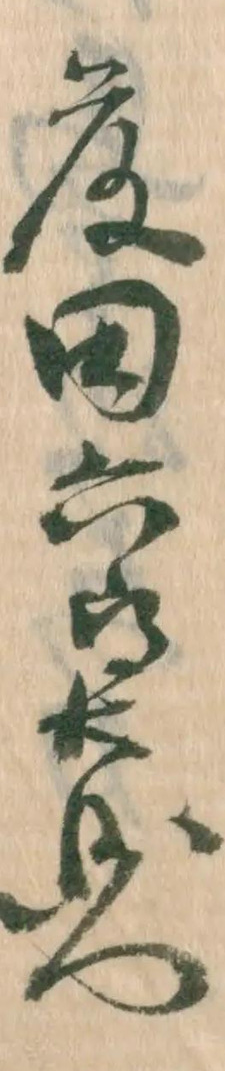藤田六郎右衛門
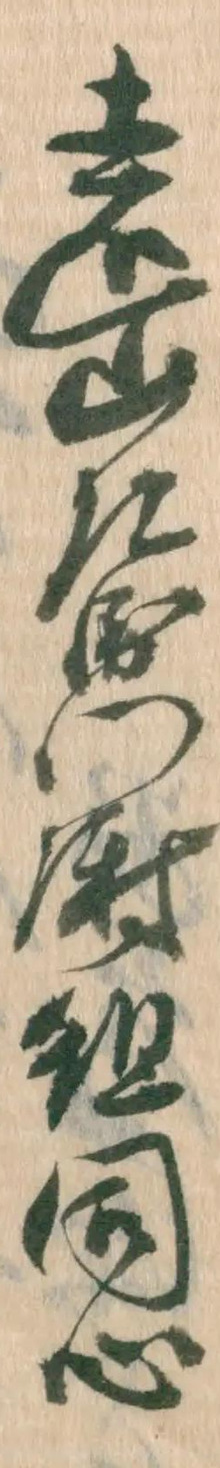遠山左衛門尉組同心
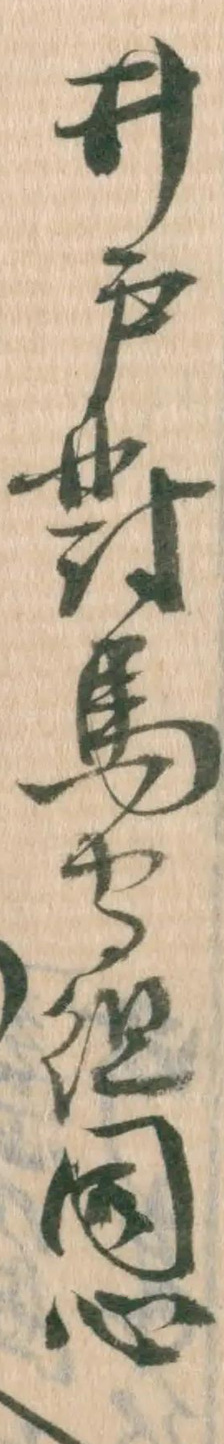井戸対馬守組同心
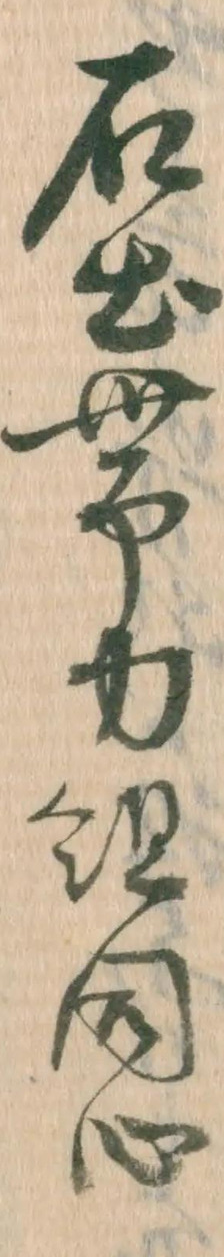石出帯刀組同心
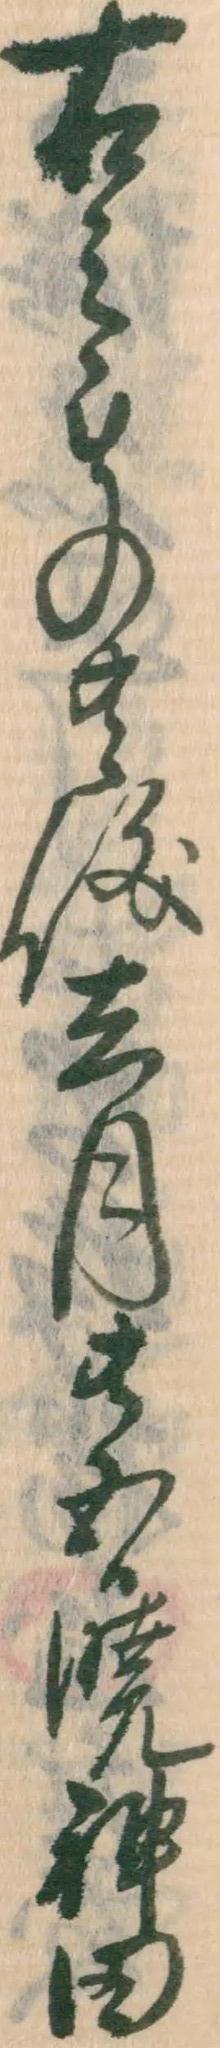右之もの共儀去月廿五日暁神田
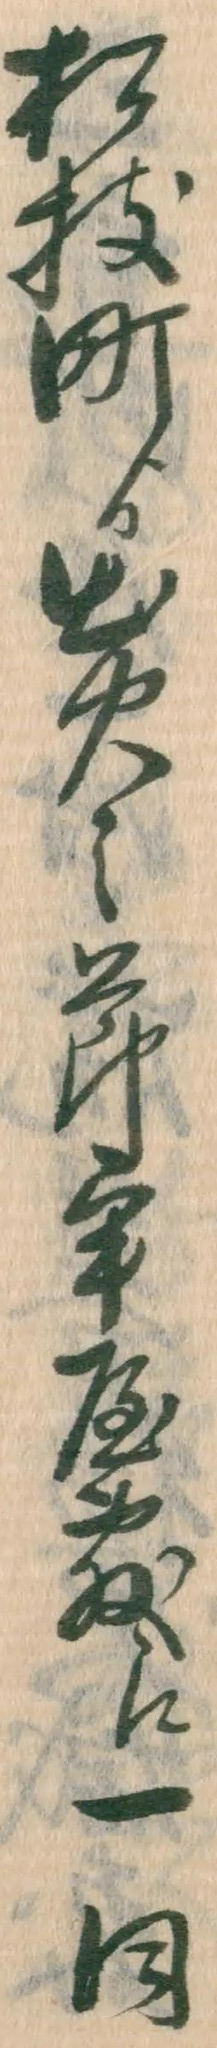松枝町ゟ出火之節牢屋敷え一同
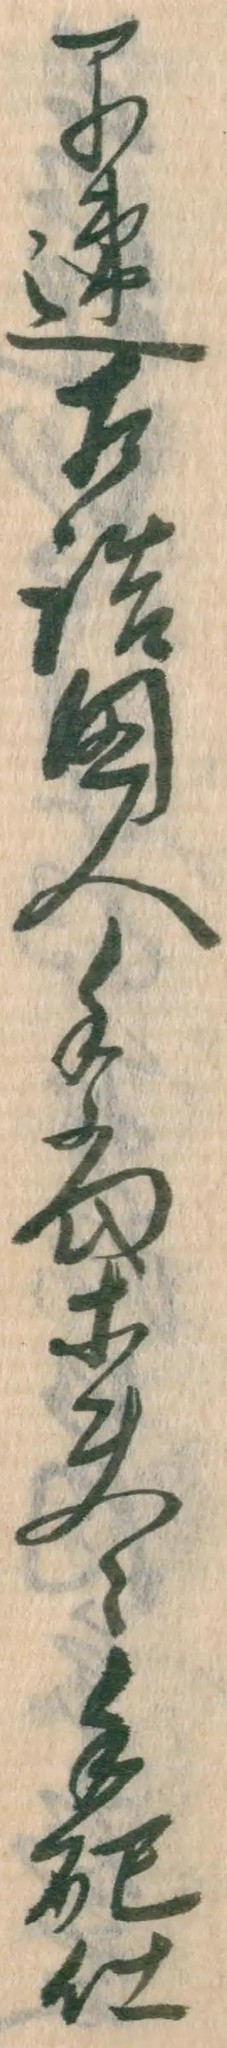早速相詰囚人手当等夫〻手配仕
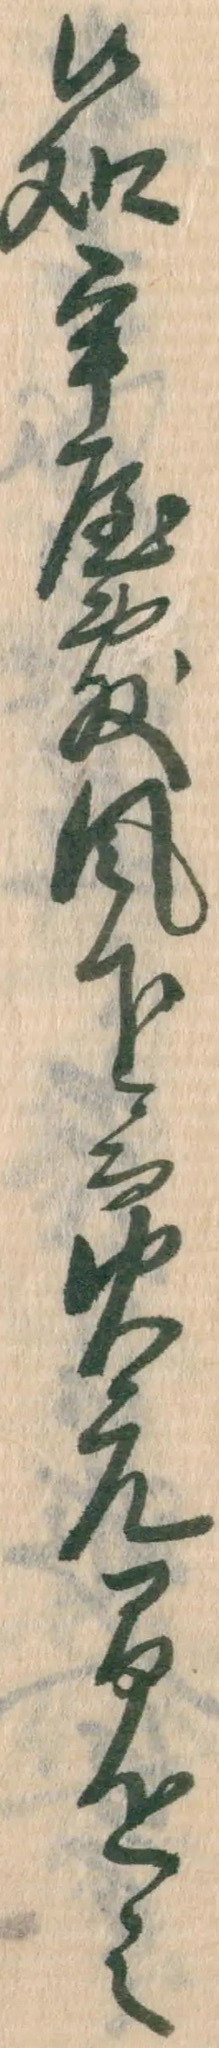候処牢屋敷風下ニて火元間近之
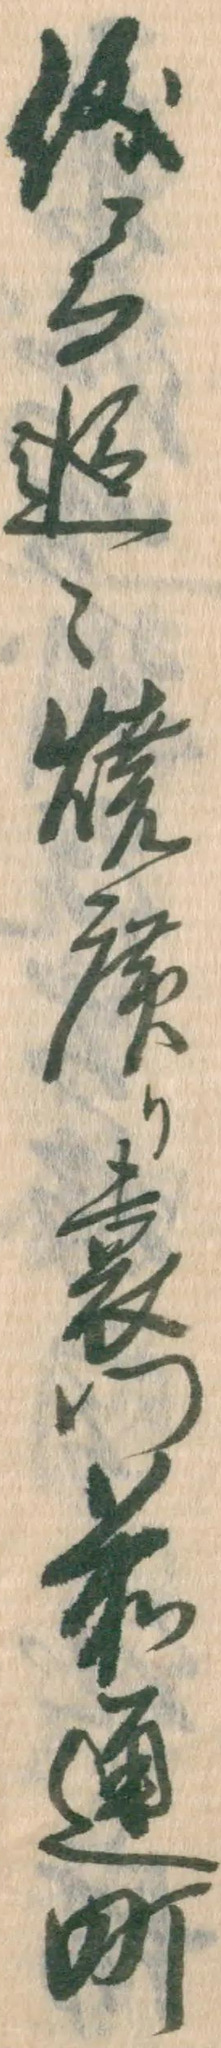儀ニて追〻焼広り裏門前通町
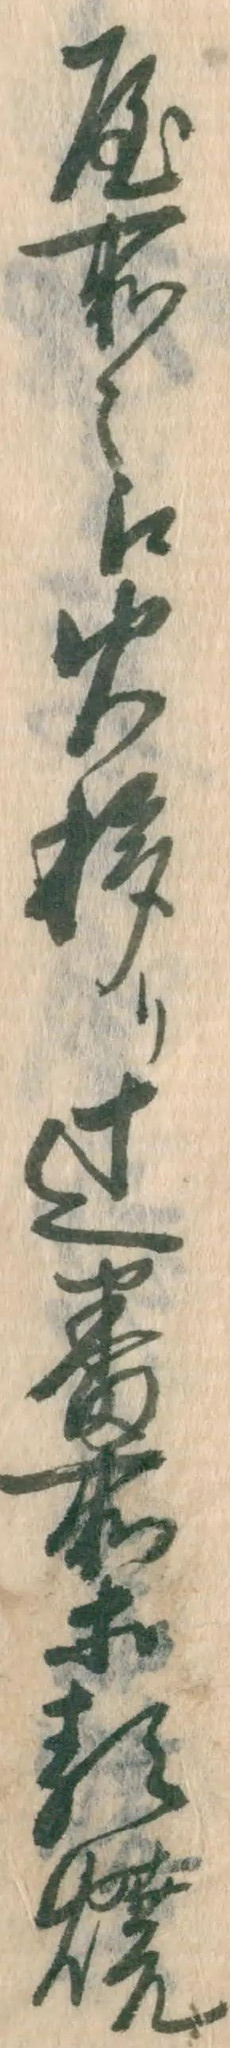屋所〻え火移り辻番所等類焼

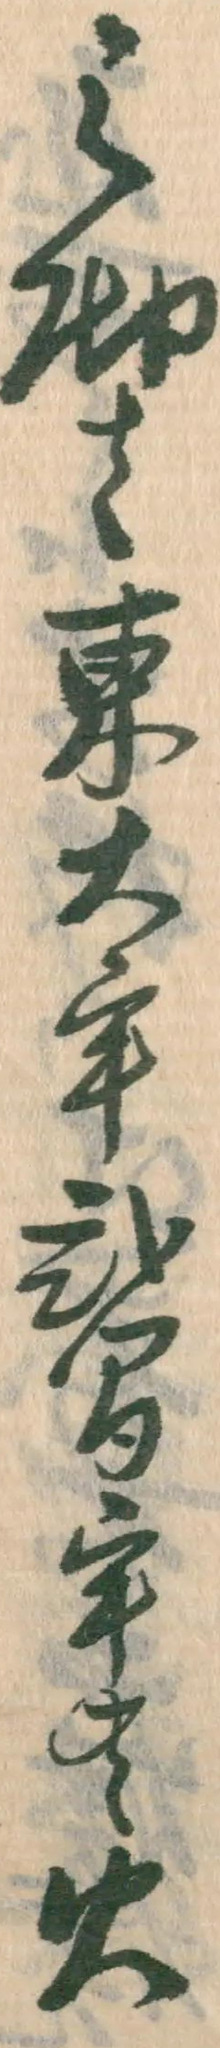之砌は東大牢弐間牢共火
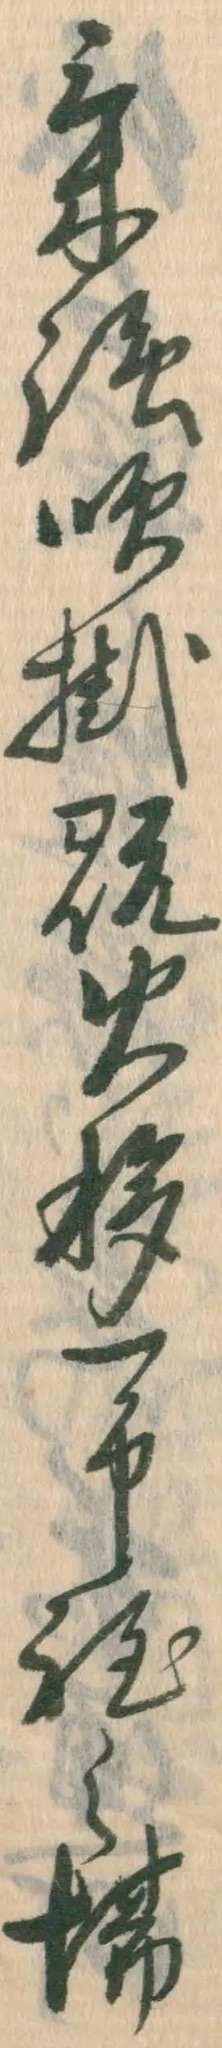気強吹掛既火移可申程之場
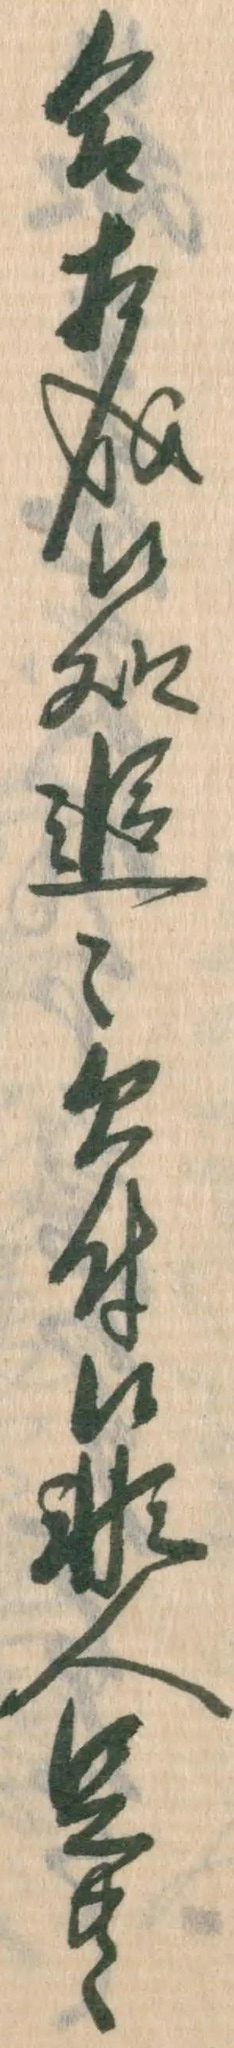合相成候処追〻欠付候非人足共
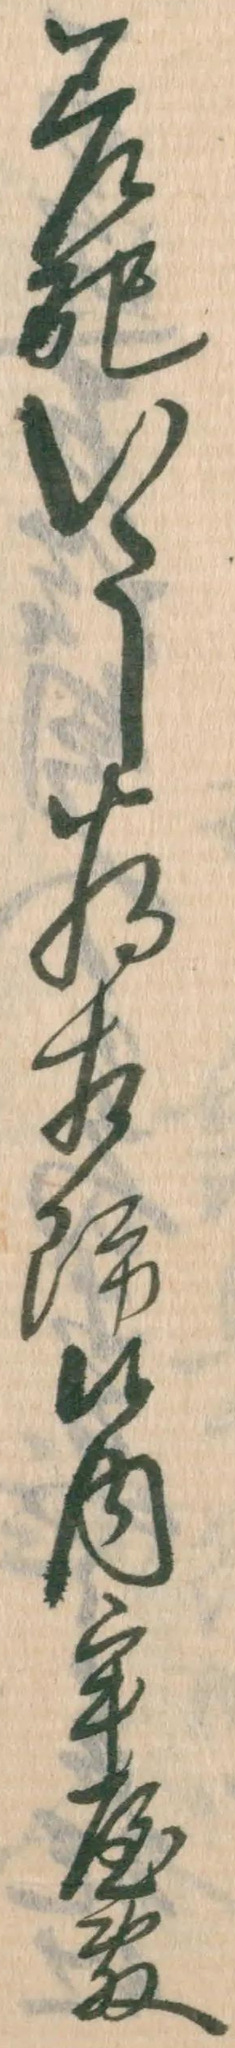差配いたし為相防候内牢屋敷
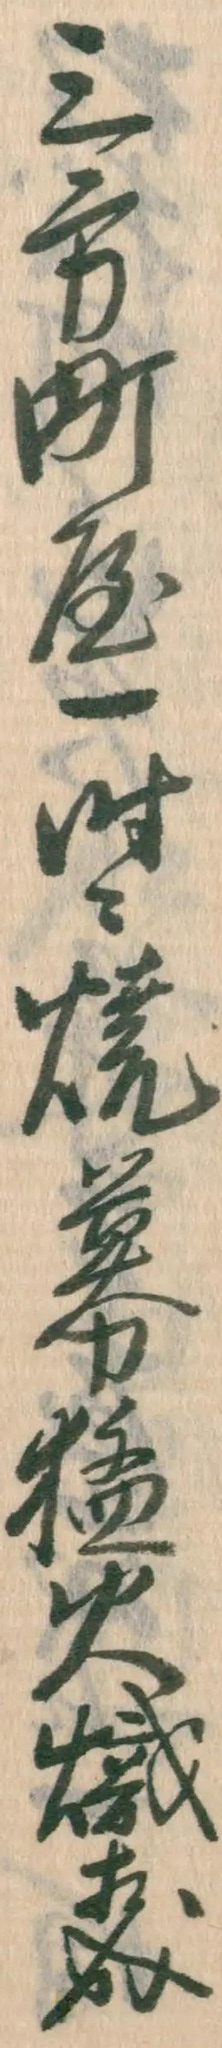三方町屋一時ニ焼募猛火熾相成
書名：七十冊物類集 71巻. [44] 四十三 牢屋敷御普請御修覆地震ニ付骨折候牢屋掛御褒美之部
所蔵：国立国会図書館 National Diet Library, JAPAN
